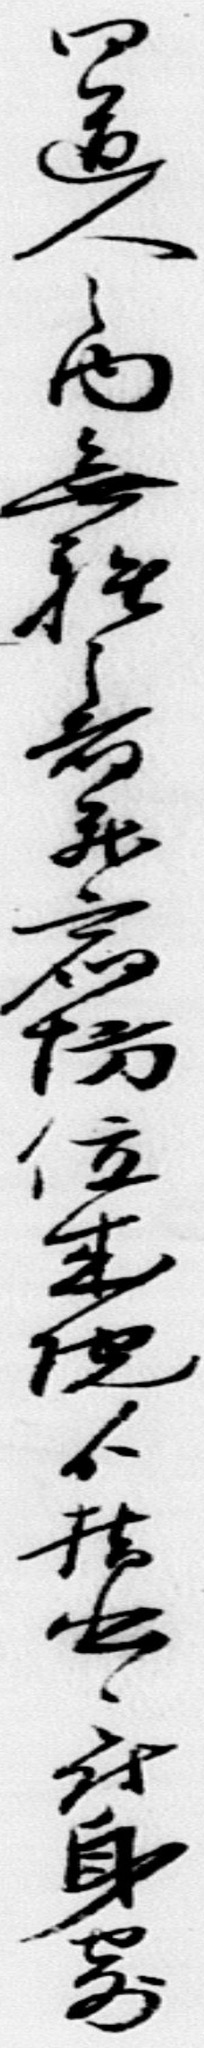同道人之内無難之者幷宿坊位成院ゟ指出候に付身寄
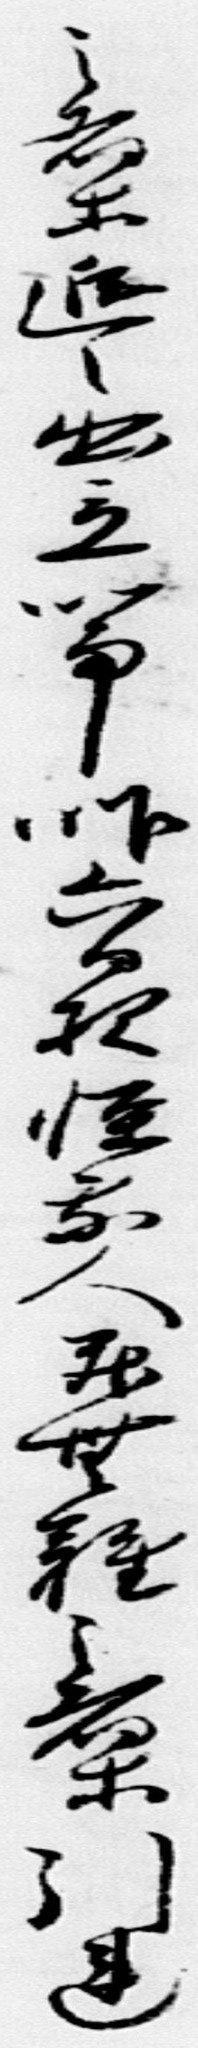之者等追々出立いたし昨六日夜怪我人幷無難之者等引連
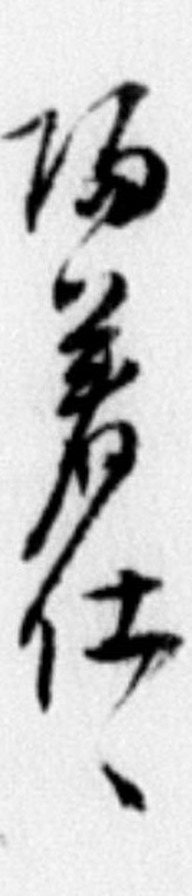帰着仕候
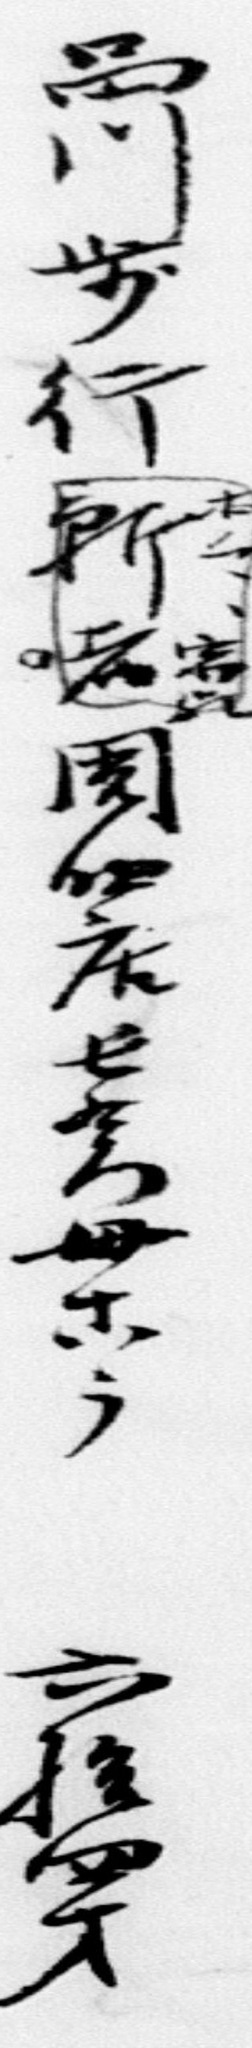品川歩行新宿周助店長右衛門母こう六拾四才
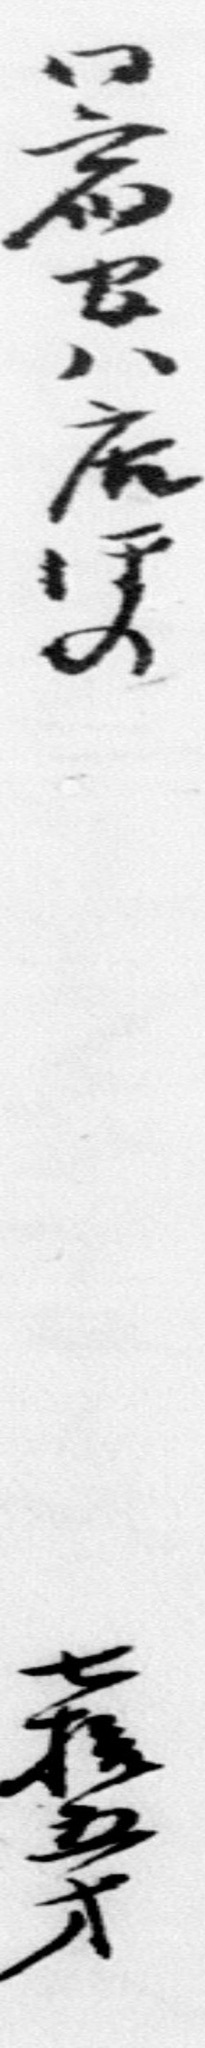同宿官八店ほの七拾五才
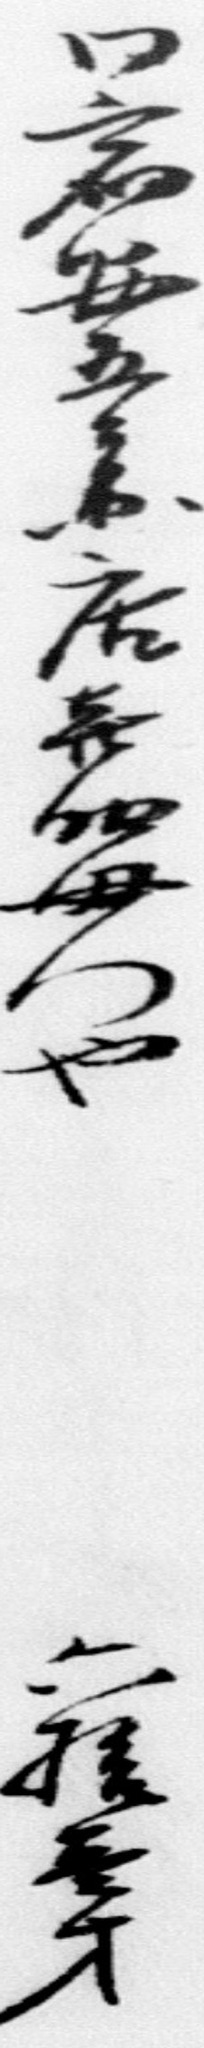同宿安五兵衛店喜助母つや六拾壱才
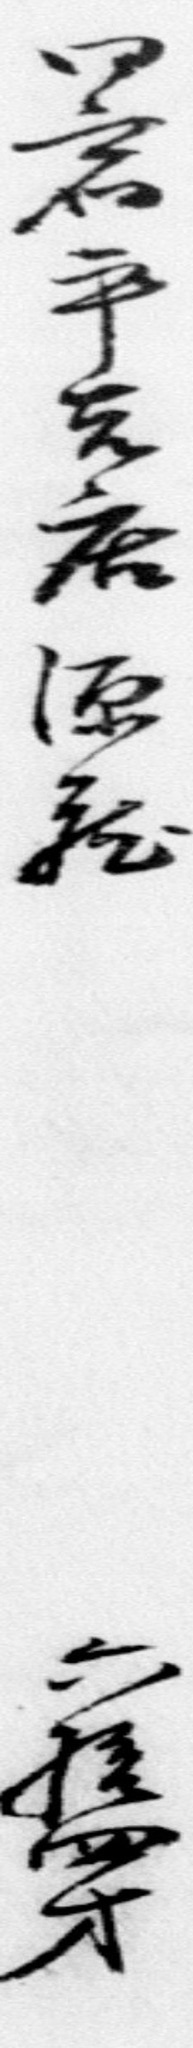同宿平吉店源蔵六拾四才
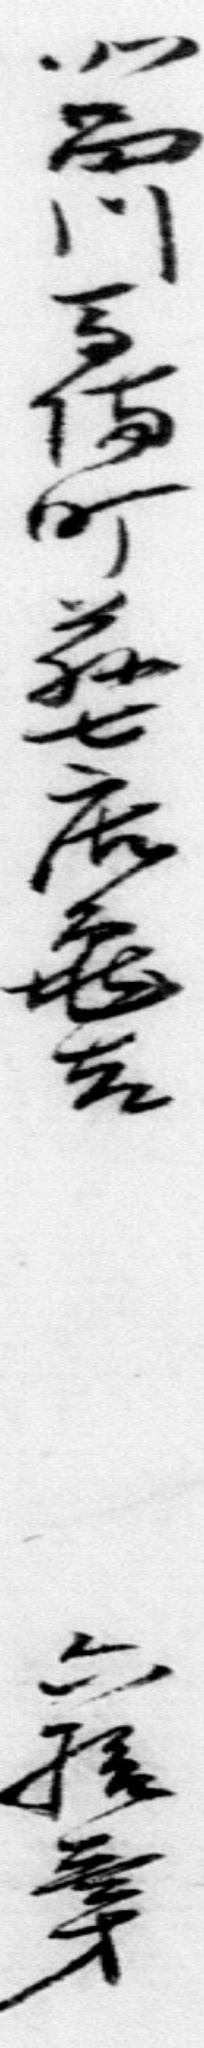北品川馬場町藤七店亀吉六拾壱才
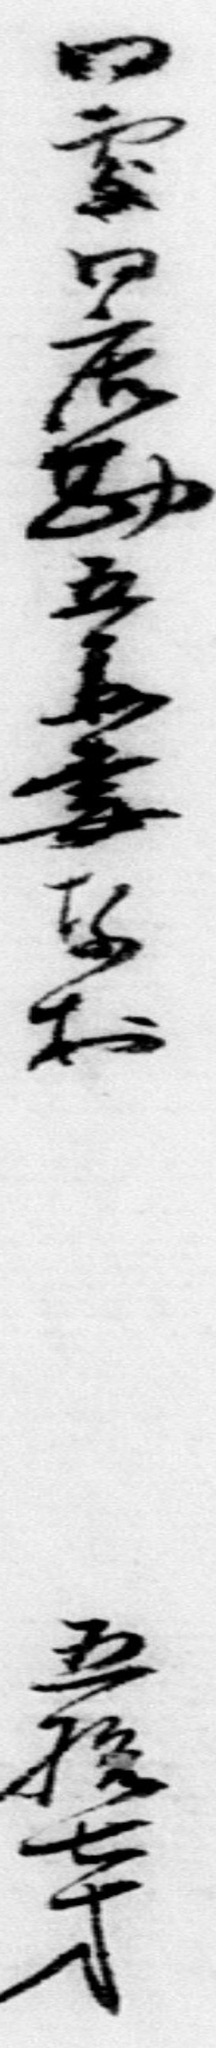同所同店勘五兵衛妻なお五拾七才
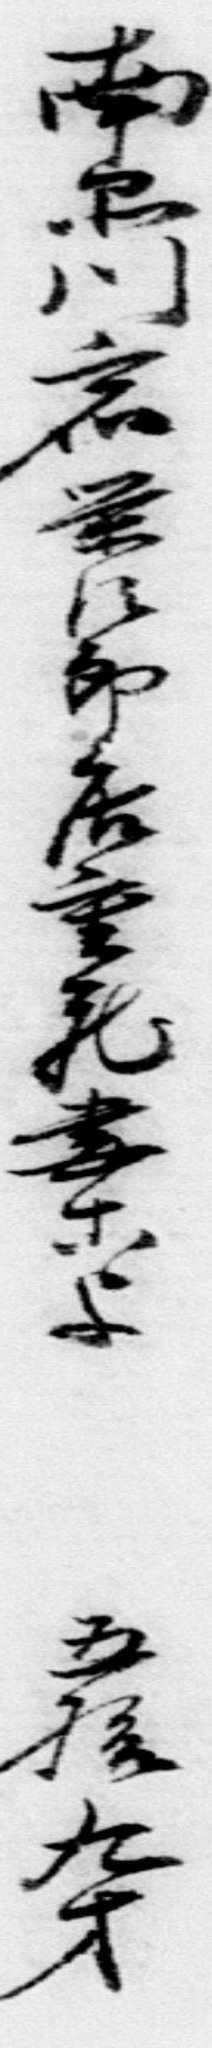南品川宿栄次郎店重蔵妻こよ五拾九才
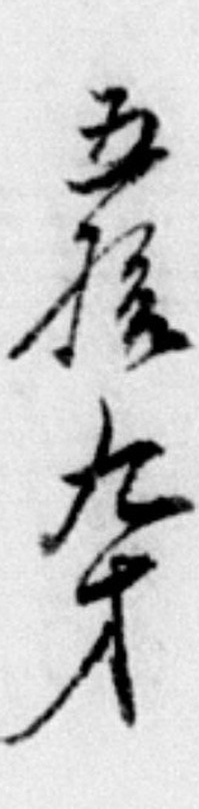四拾九才
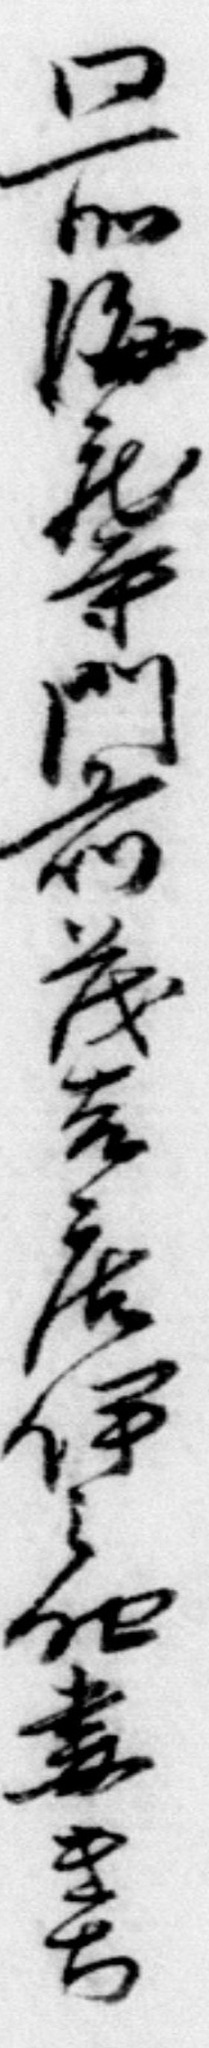同所海蔵寺門前茂吉店伊之助妻きち
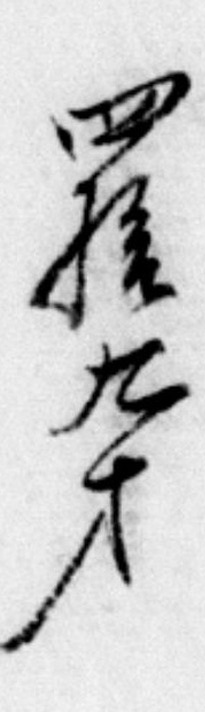四拾九才

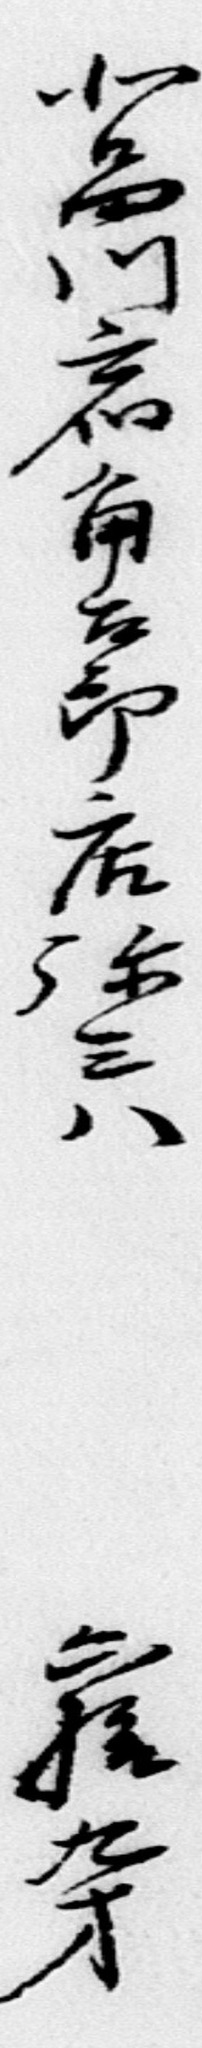北品川宿角太郎店弥三八六拾九才
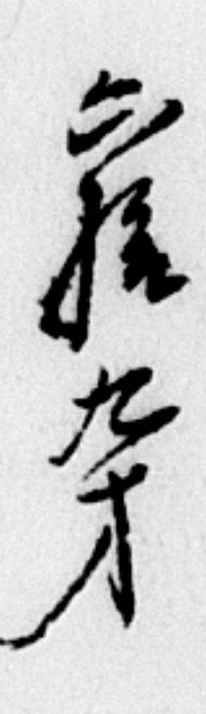六拾八才
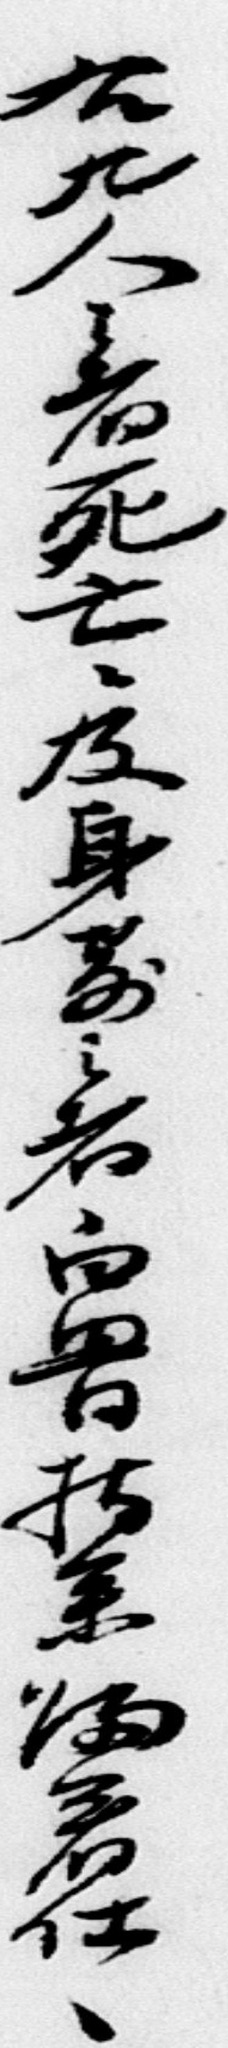右九人之者死亡に及身寄之者白骨持参帰着仕候
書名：信州大地震一件
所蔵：徳島県立図書館
